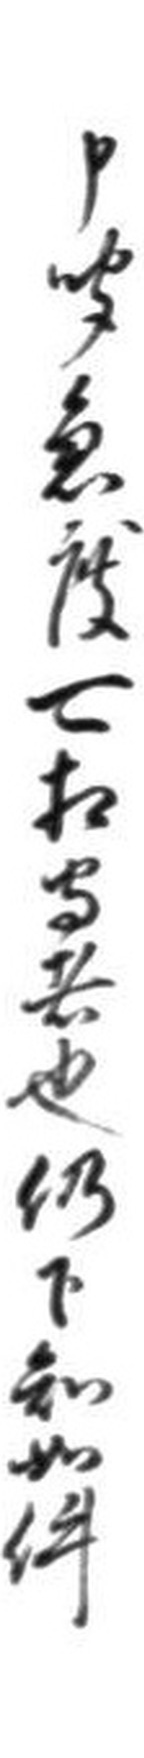申聞急度可相守者也仍下知如件
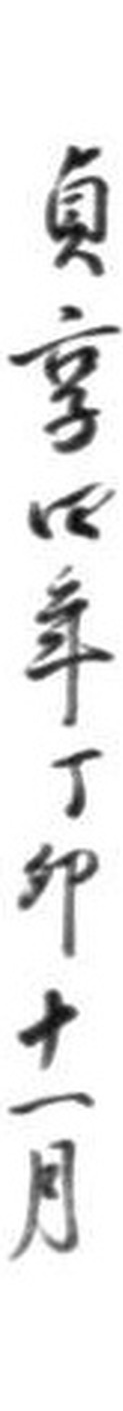貞享四年丁卯十一月
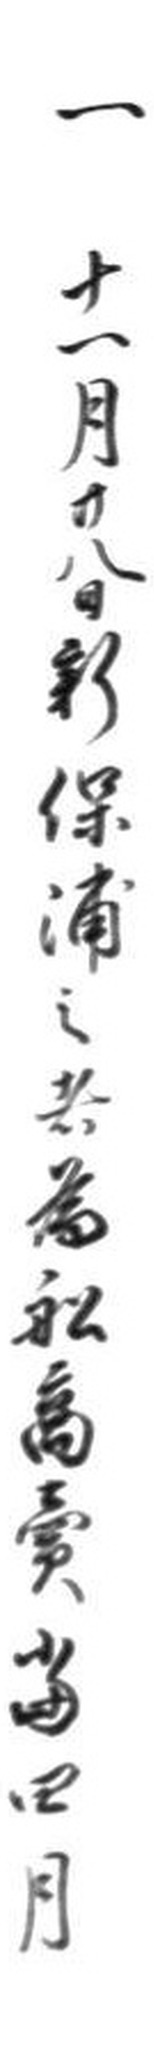一十一月廿八日新保浦之者為船商売当四月
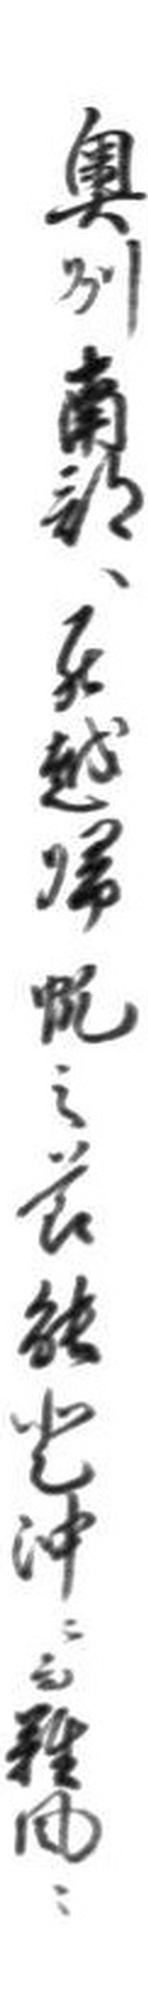奥州南部へ罷越帰帆之節能登沖ニ而難風ニ
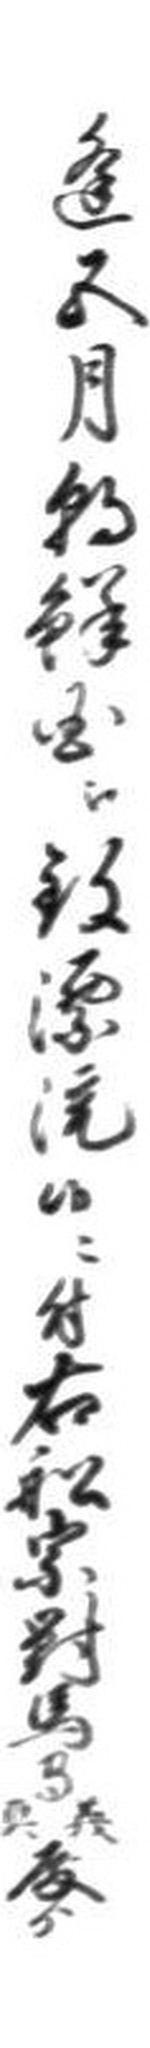逢五月朝鮮国江致漂流候ニ付右船宗対馬守義真殿ゟ
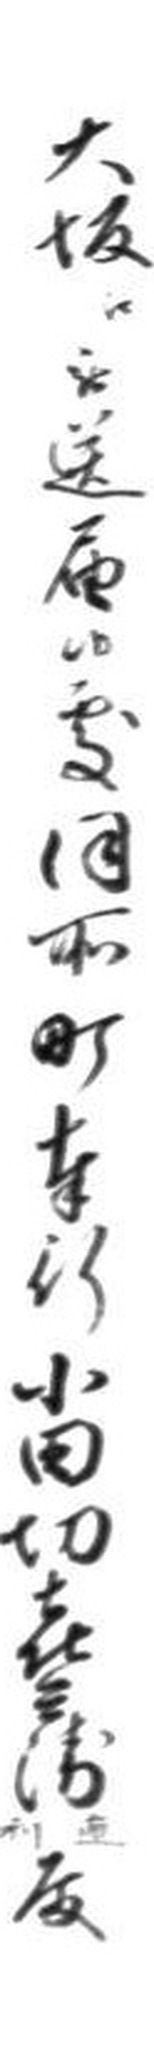大坂江被送届候処同所町奉行小田切喜兵衛直利殿

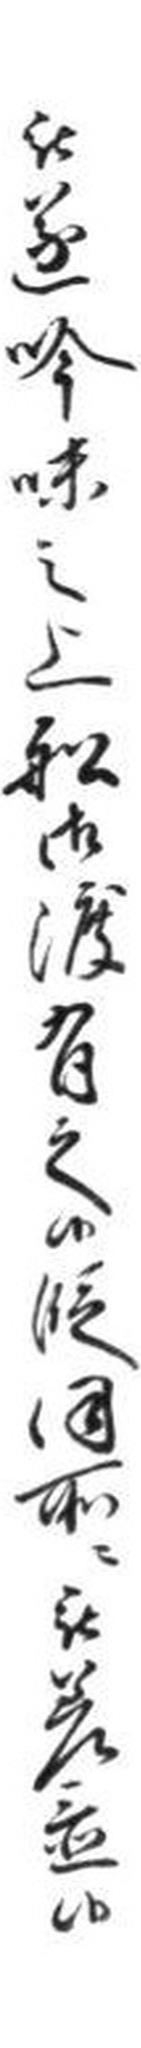被遂吟味之上船御渡有之候段同所ニ被差置候
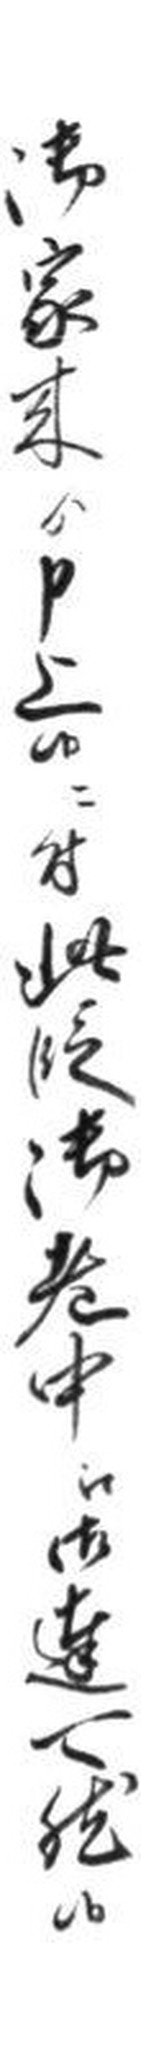御家来ゟ申上候ニ付此段御老中江御達可然候
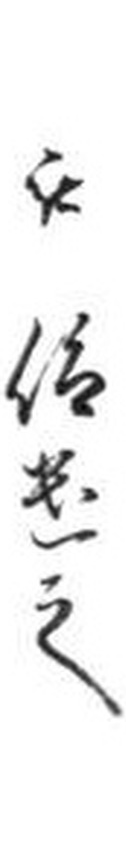被仰遣之
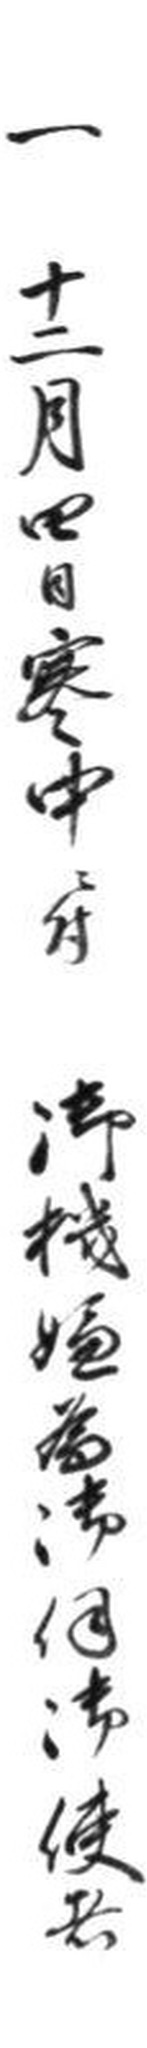一十二月四日寒中ニ付御機嫌為御伺御使者
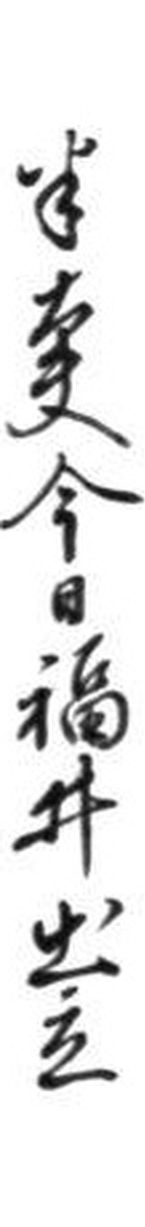半太夫今日福井出立
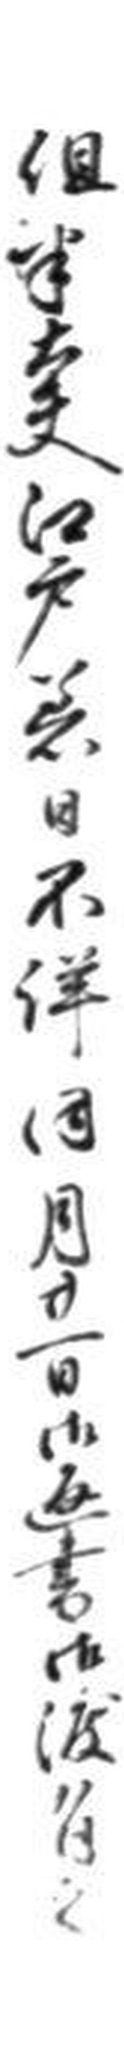但半太夫江戸着日不詳同月廿一日御返書御渡有之
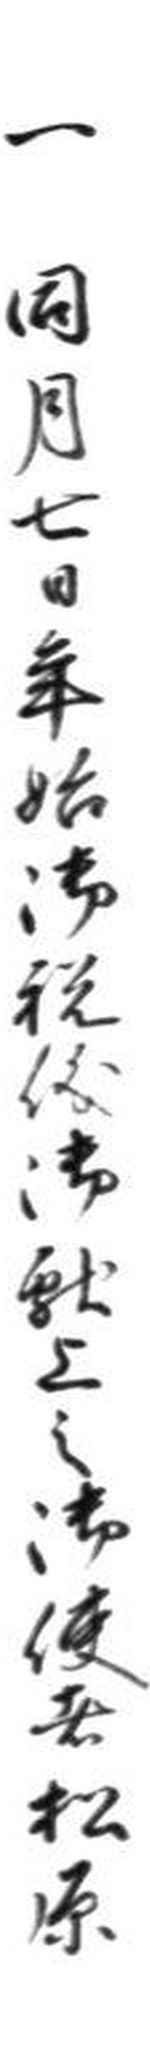一同月七日年始御祝儀御献上之御使者松原
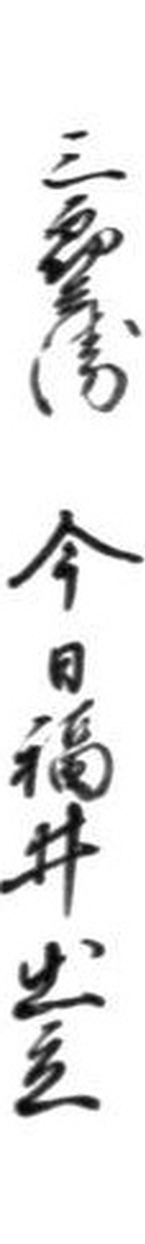三郎兵衛今日福井出立
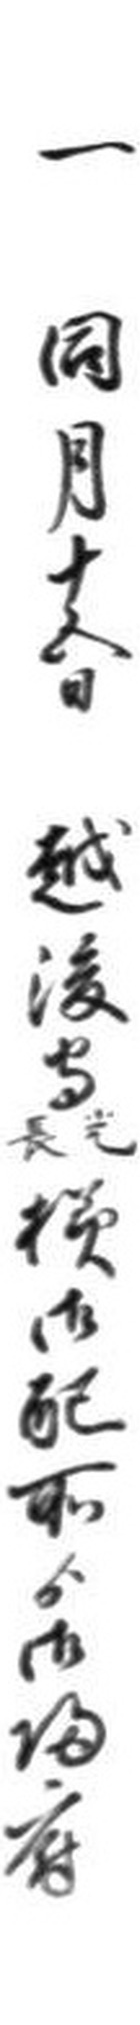一同月十五日越後守光長様御配所ゟ御帰府
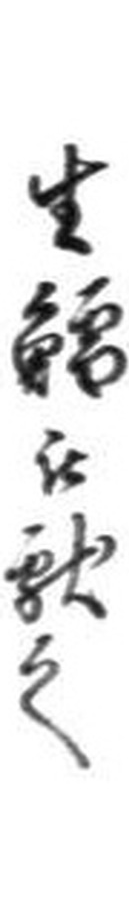生鱈被献之
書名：家譜 十六 吉品公 従貞享三年閏三月到同四年
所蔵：福井県文書館 Fukui Prefectural Archives
